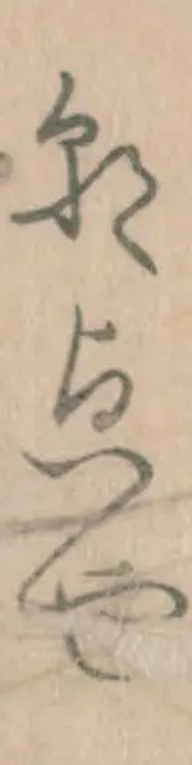朝皃や
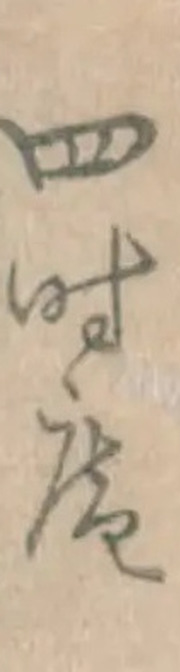四時庵

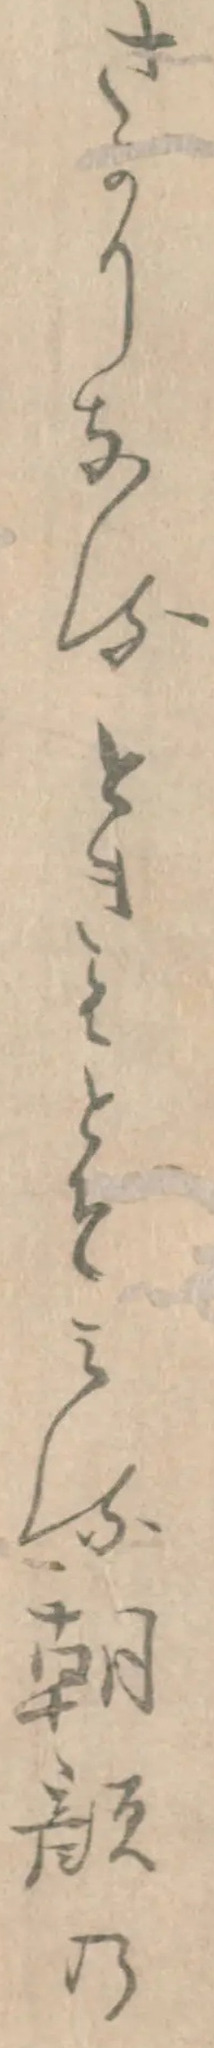さかりなるときはとそみる朝顔の
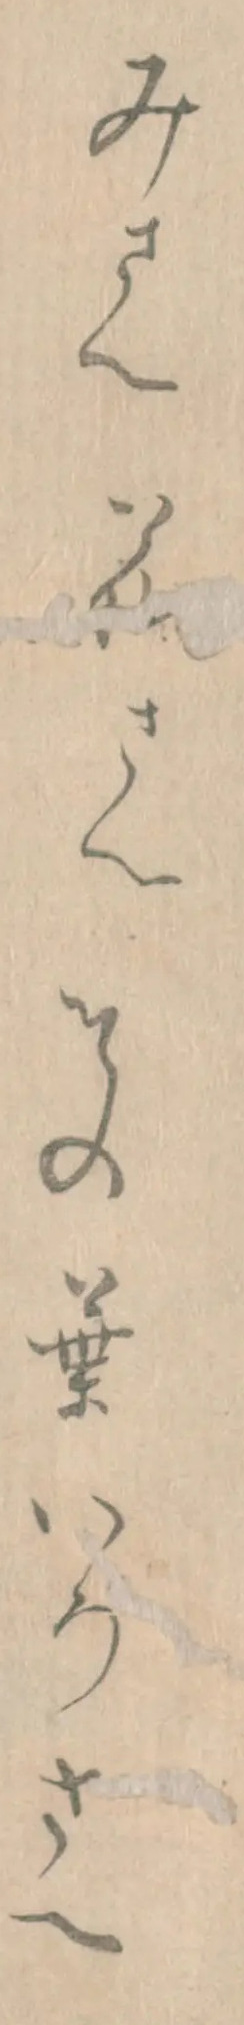みさへ花さへその葉いろさへ
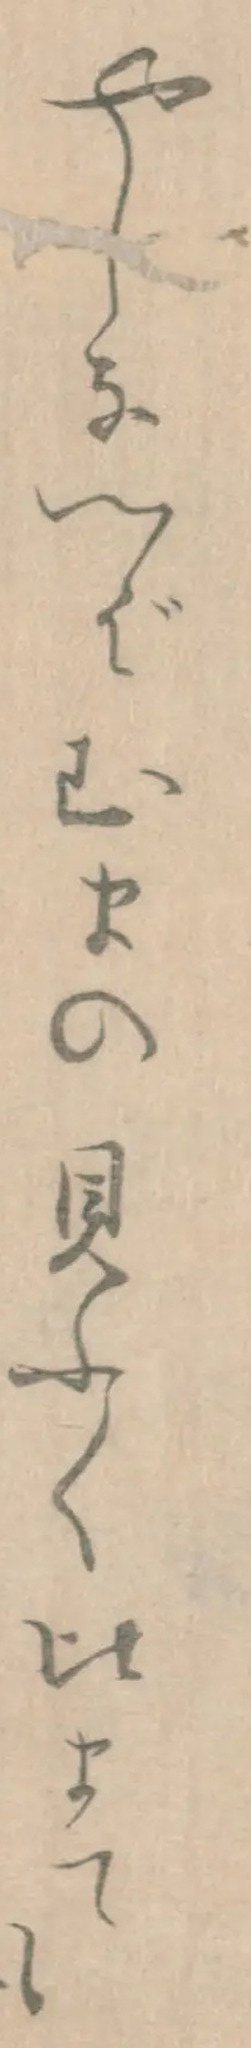やしなへばむまの貝ふく比まても
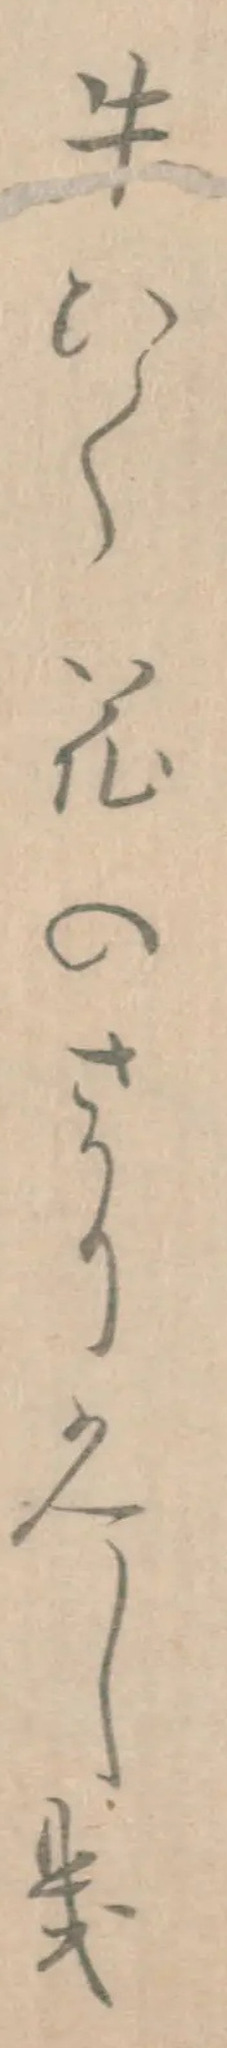牛ひく花のさかり久しき
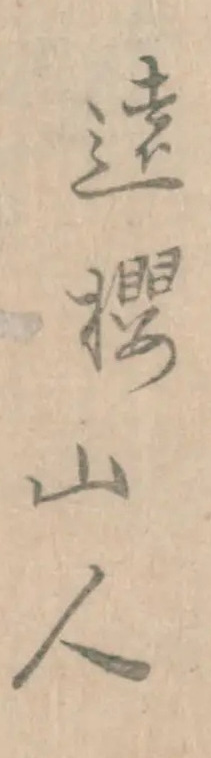遠桜山人
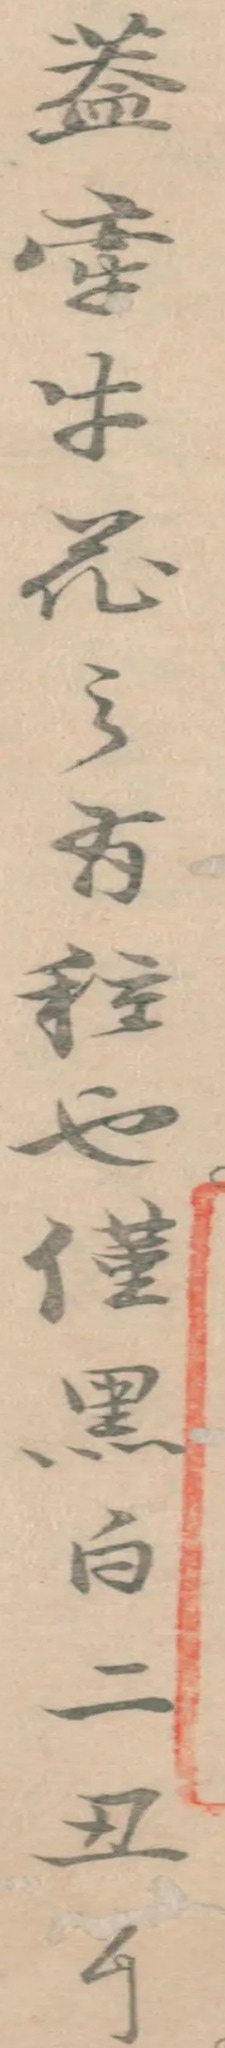葢牽牛花之有種也。僅黒白二丑耳。
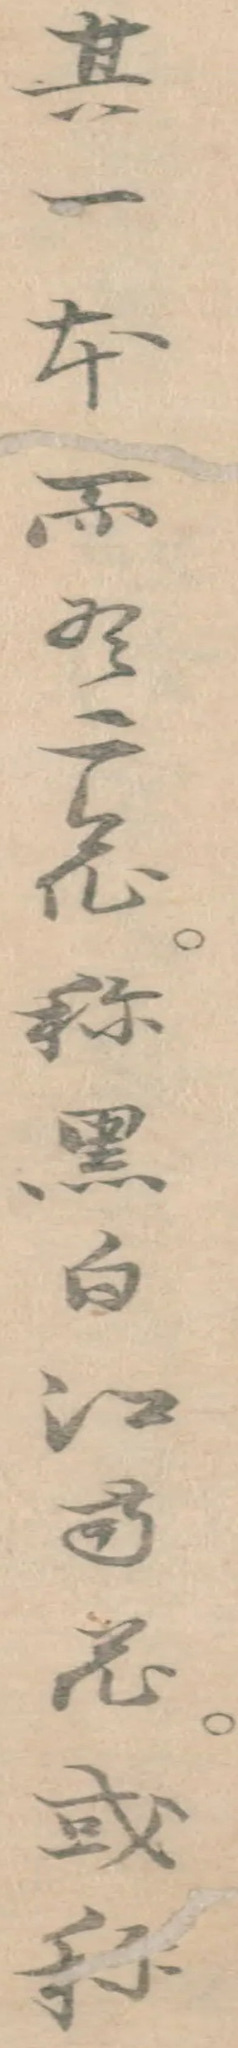其一本而有二花。称黒白江南花。或称
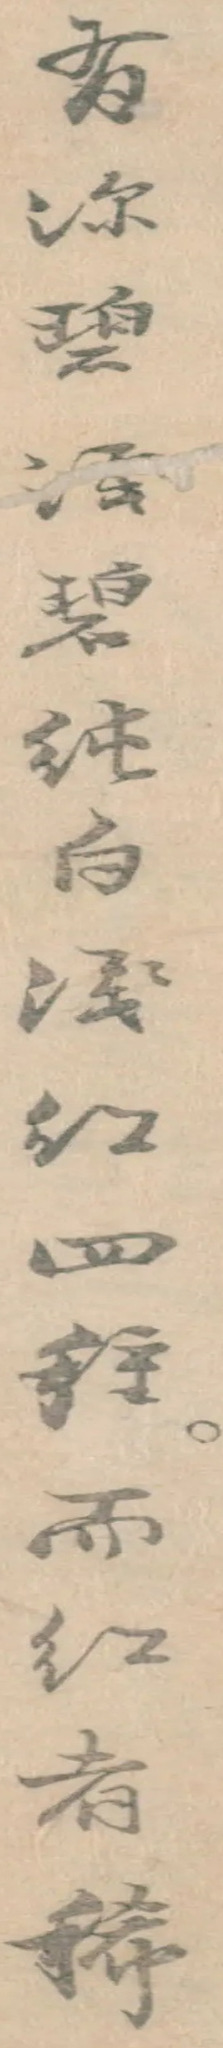有深碧浅碧純白浅紅四種。而紅者稀
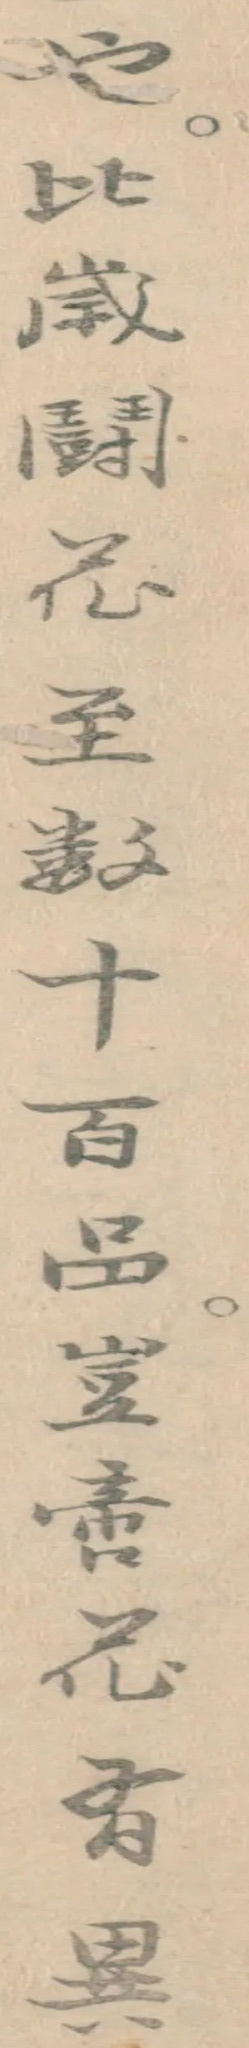也。比歳闘花至数十百品。豈啻花有異
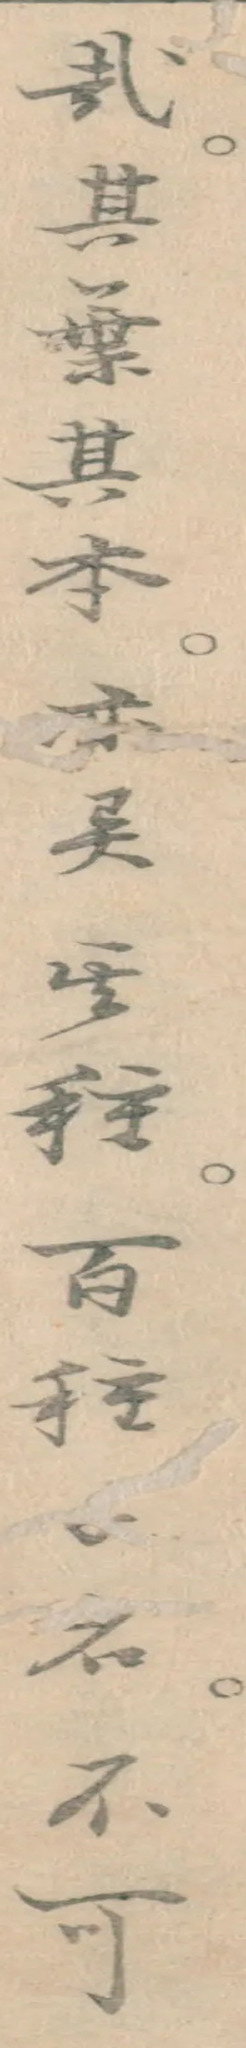哉。其葉其本。亦異其種。百種。不可
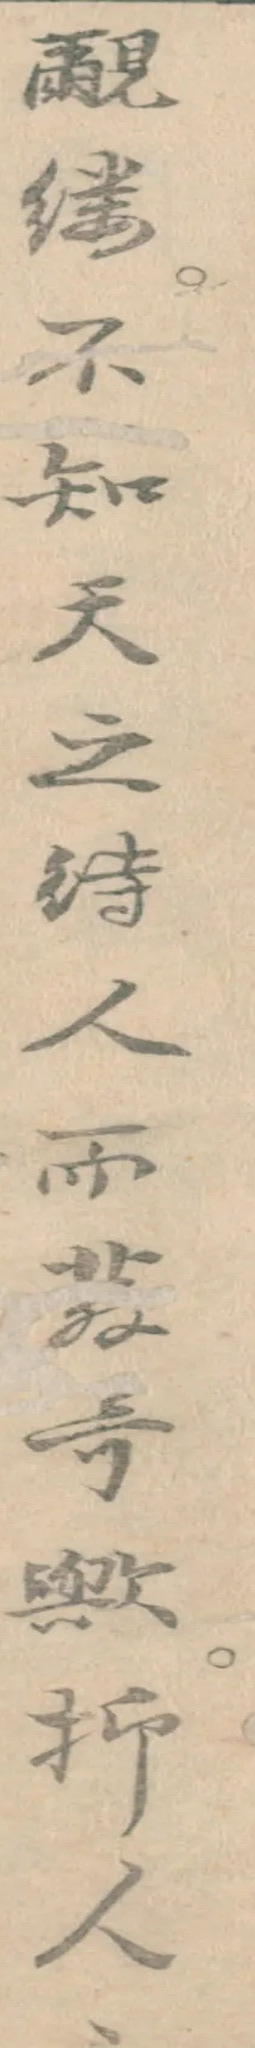覼縷。不知天之待人而散奇歟。抑人之
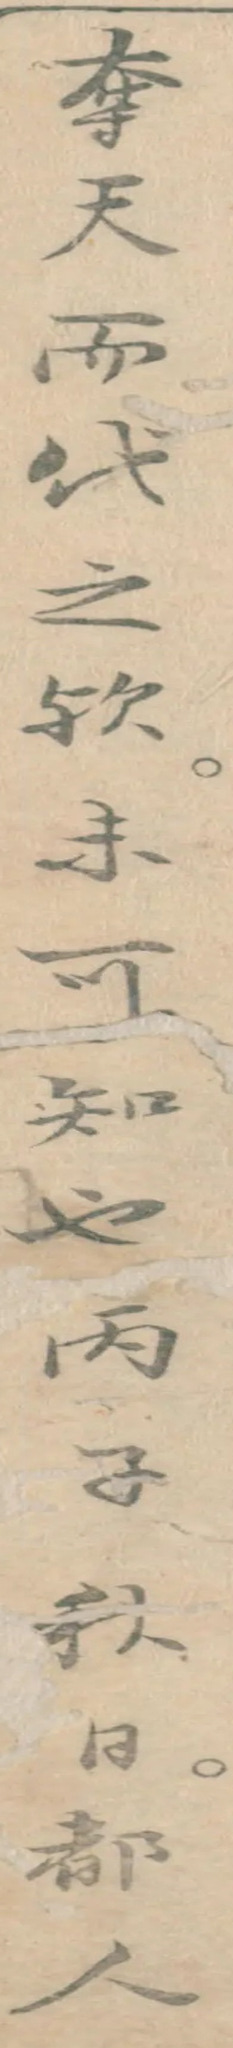奪天而代之歟。未可知也。丙子秋日。都人

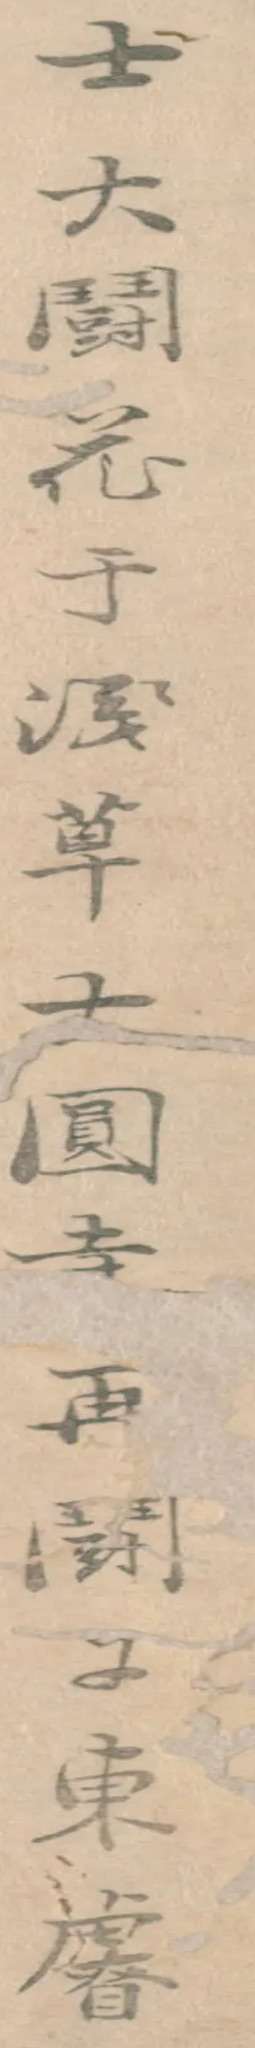士大闘花于浅草大円寺。再闘于東叡
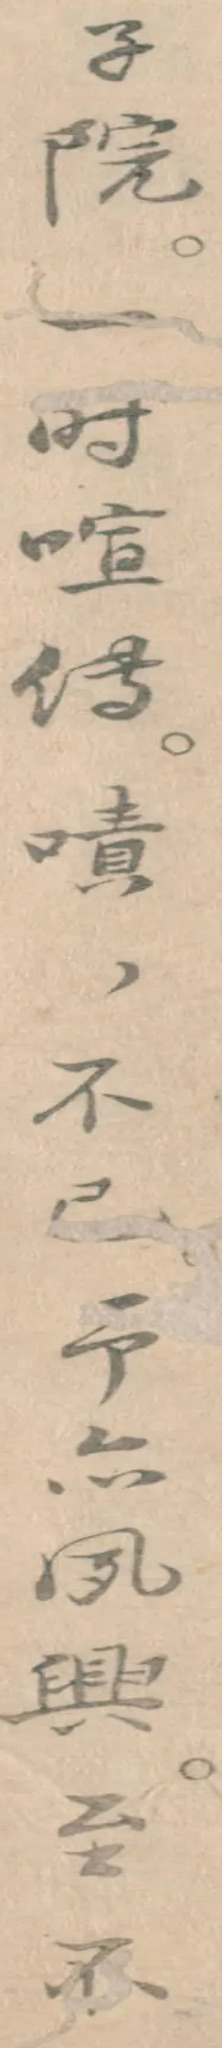子院。一時喧伝。嘖々不已。予亦夙興。至不
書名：朝顔叢. 上巻
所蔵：国立国会図書館 National Diet Library, JAPAN
